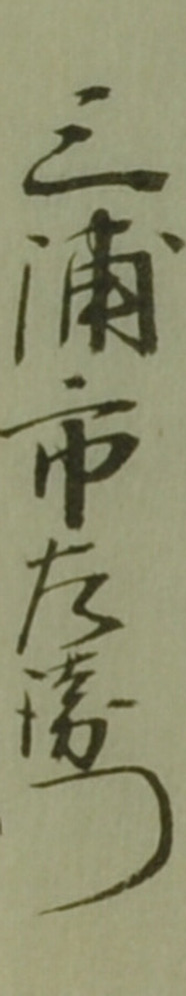三浦市左衛門
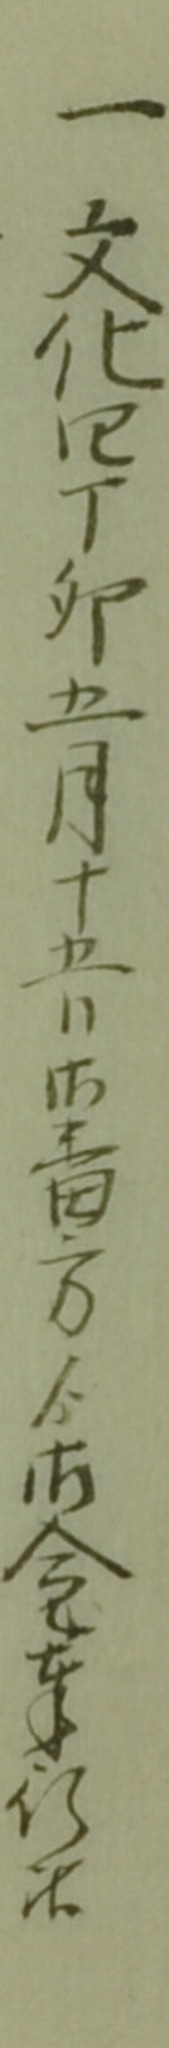一文化四丁卯五月十五日御番方ゟ御金奉行被
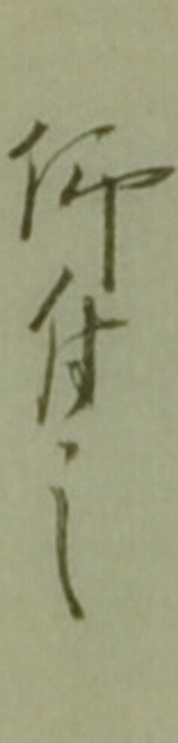仰付之
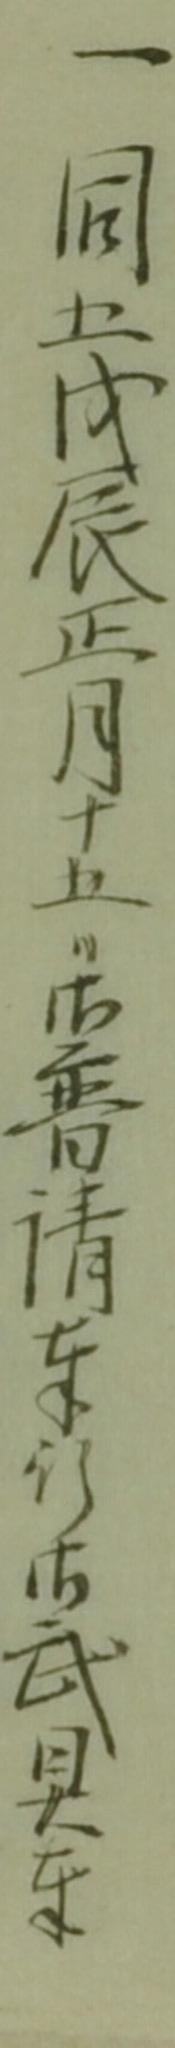一同五戊辰正月十五日御普請奉行御武具奉
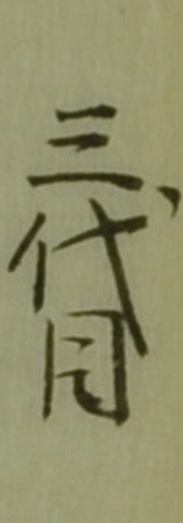三代目
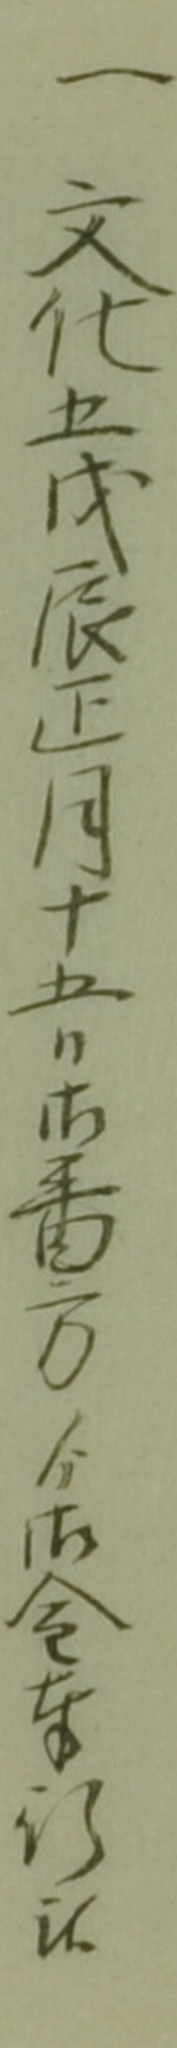一文化五戊辰正月十五日御番方ゟ御金奉行被
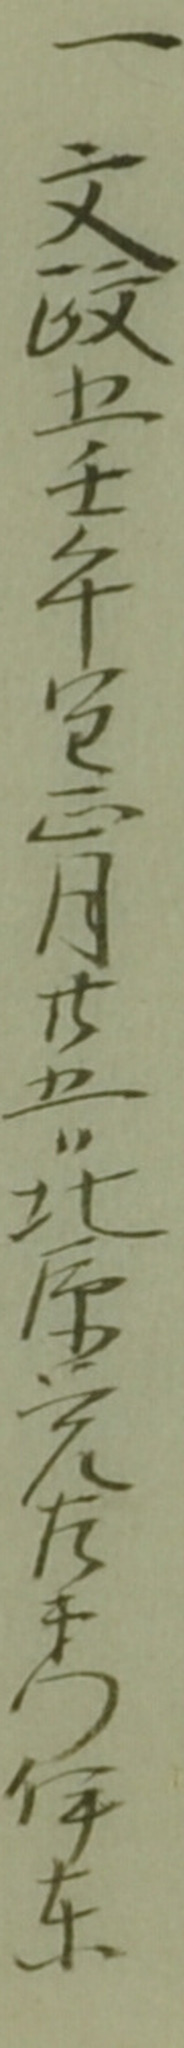一文政五壬午閏正月廿五日北原覚左衛門伊東
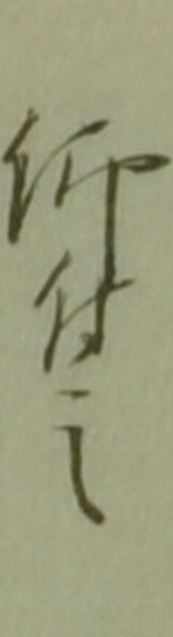仰付之
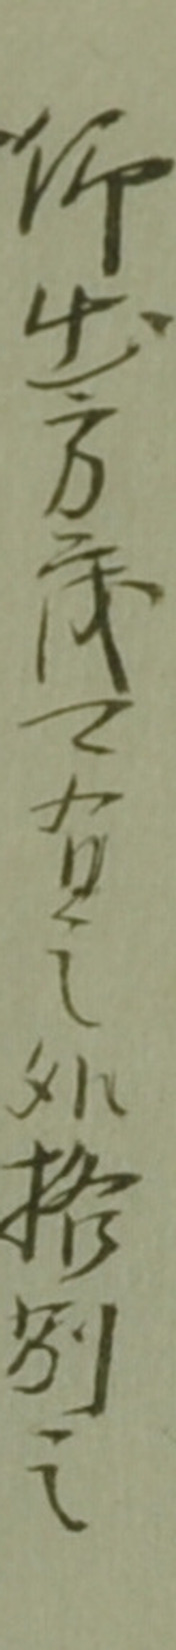仰出方茂可有之処格別之
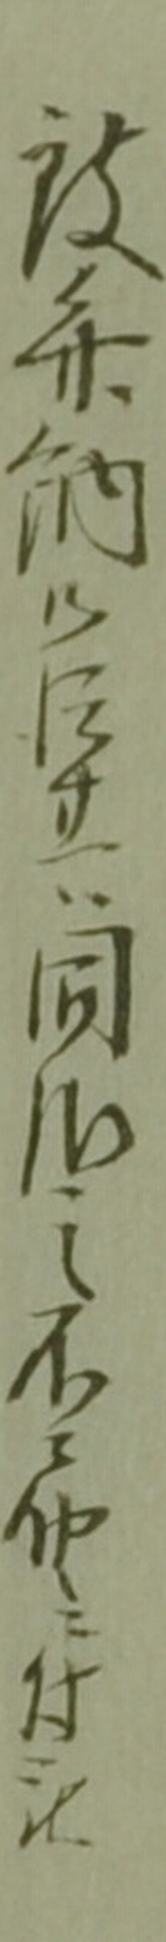致弁納候得共同様之不届ニ付被
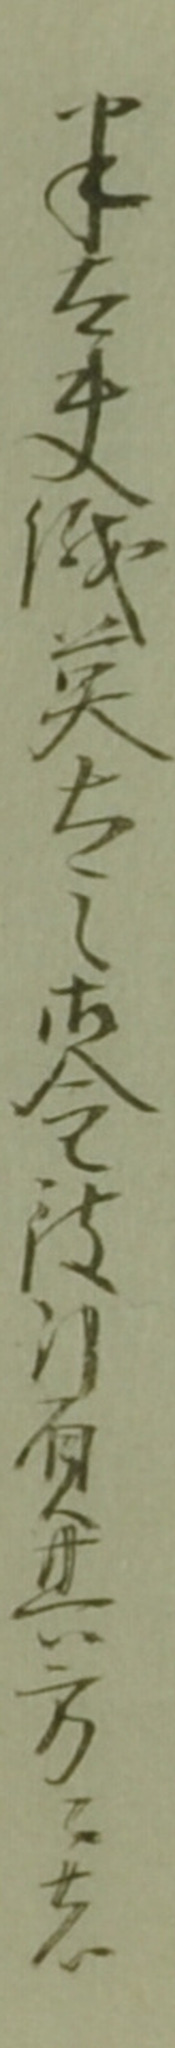半太夫儀莫大之御金致引負其方ニ者
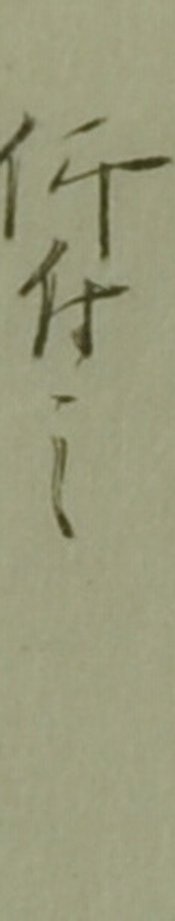仰付之
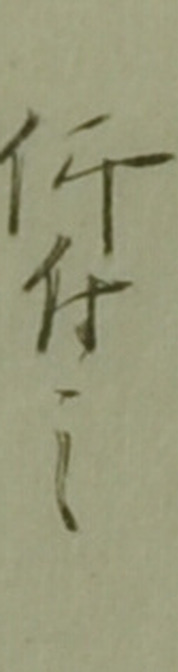仰付之
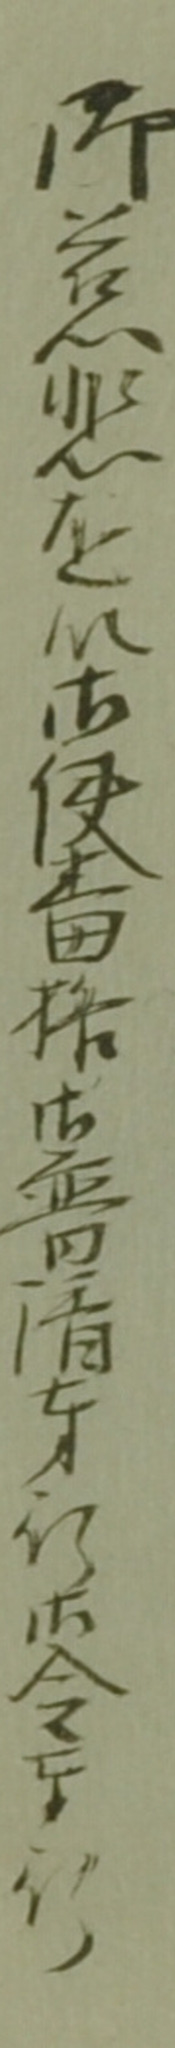御慈悲を以御使番格御普請奉行御金奉行
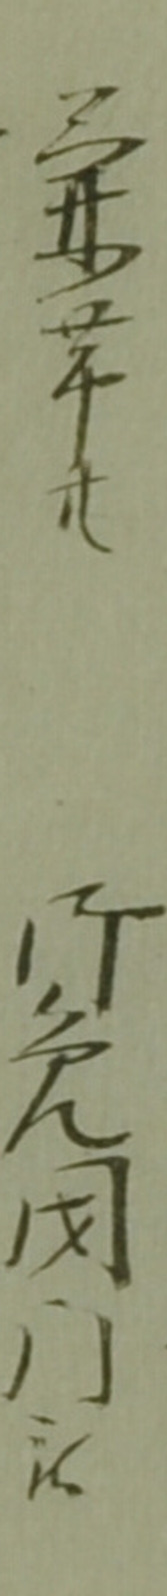兼帯共御免閉門被
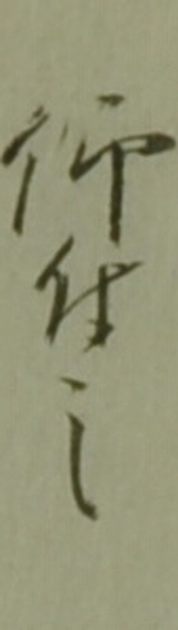仰付之
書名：諸御役代々録（七）
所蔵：伊那市立高遠町図書館・合同会社AMANE
